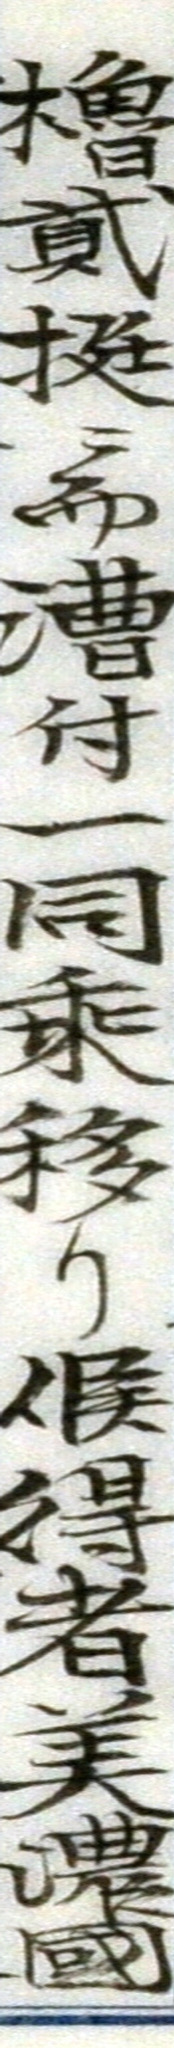漕弐挺に而漕付一同乗移り候得者美濃国
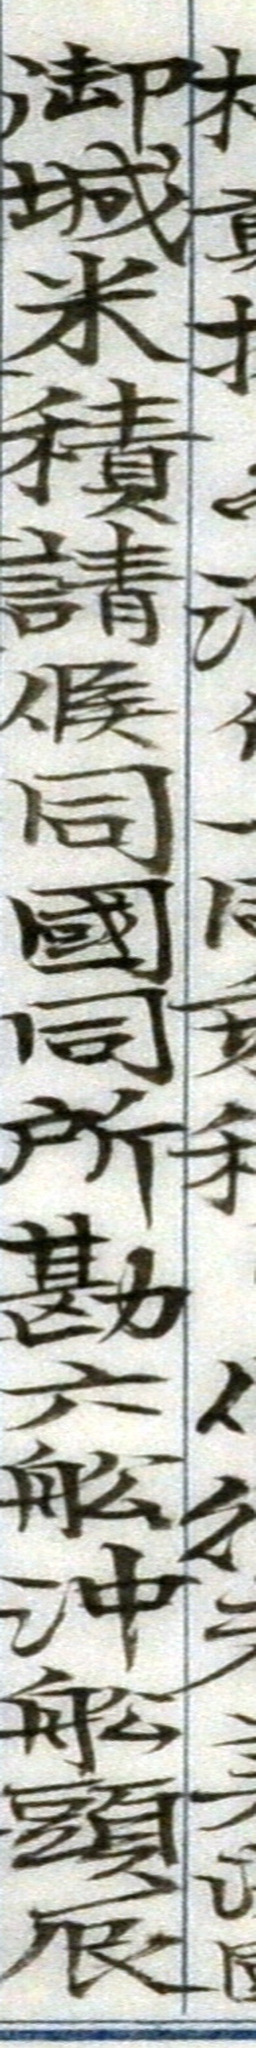御域米積請候同国同所勘六船沖船頭辰
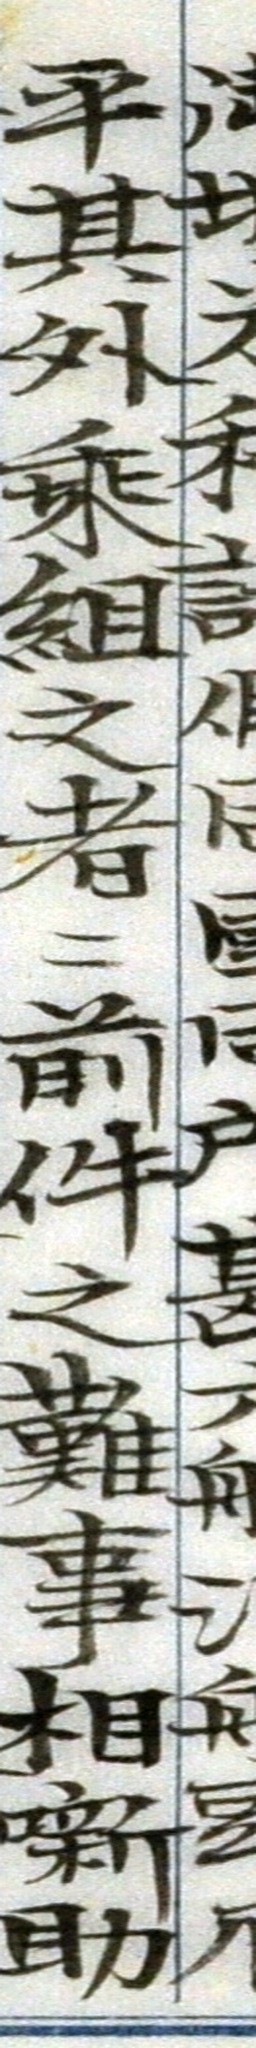平其外乗組之者に前件之難事相噺助
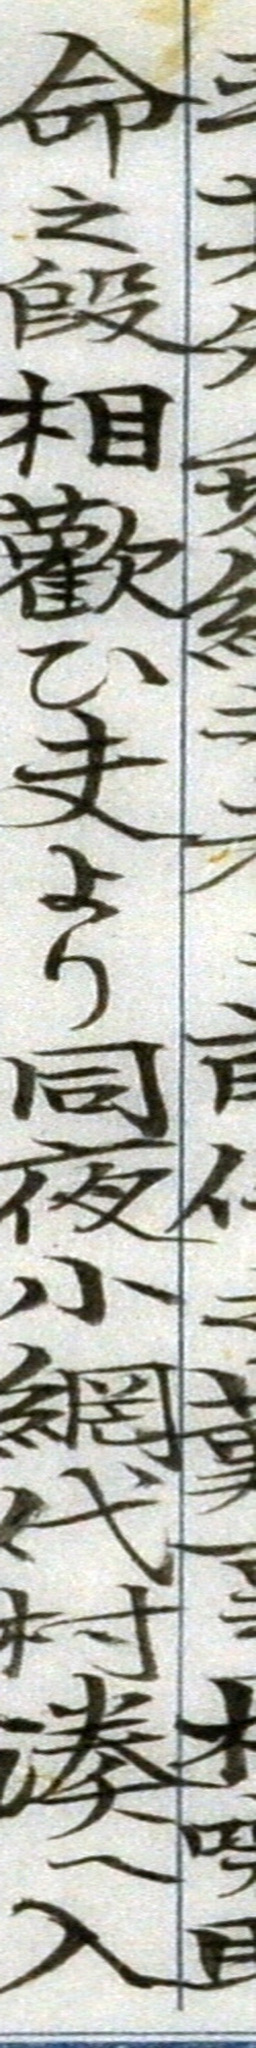命之段相歓ひ夫より同夜小網代村湊へ入
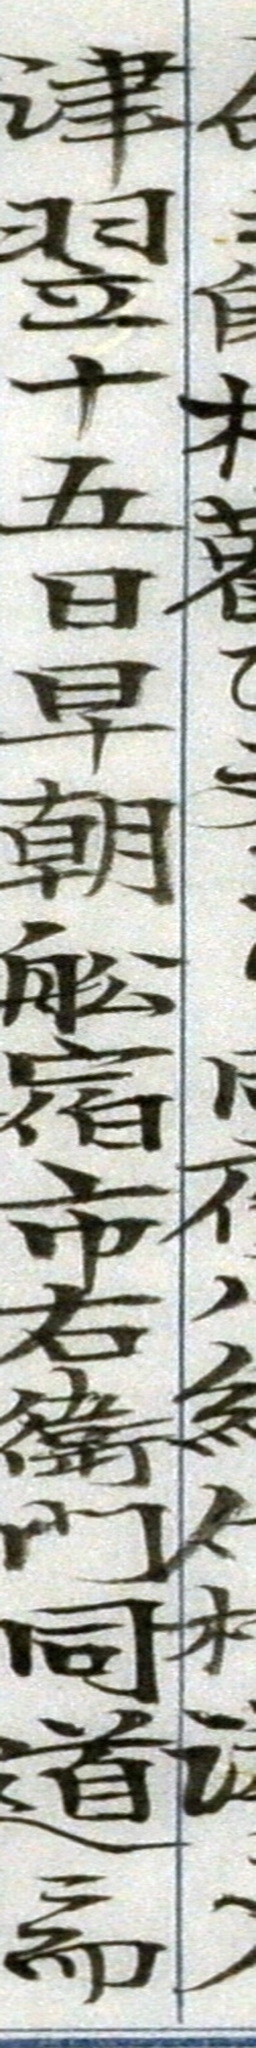津翌十五日早朝船宿市右衛門同道に而
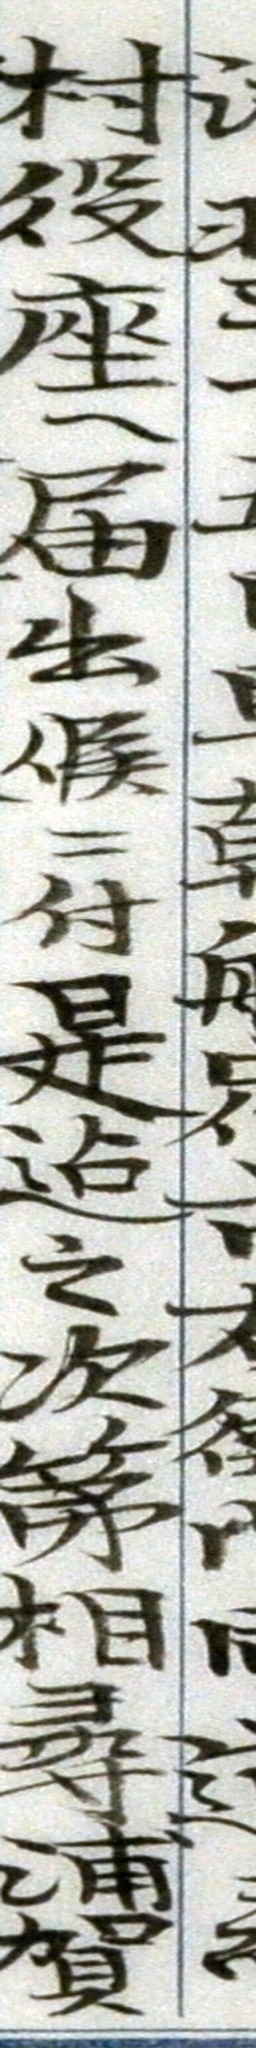村役座へ届出候に付是迄之次第相尋浦賀
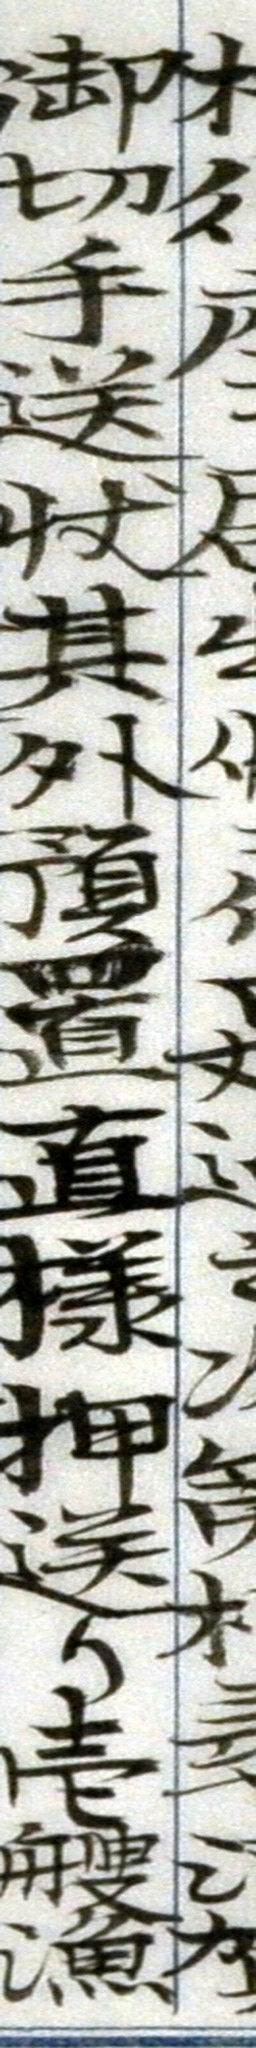御切手送状其外預置直様押送り壱艘漁
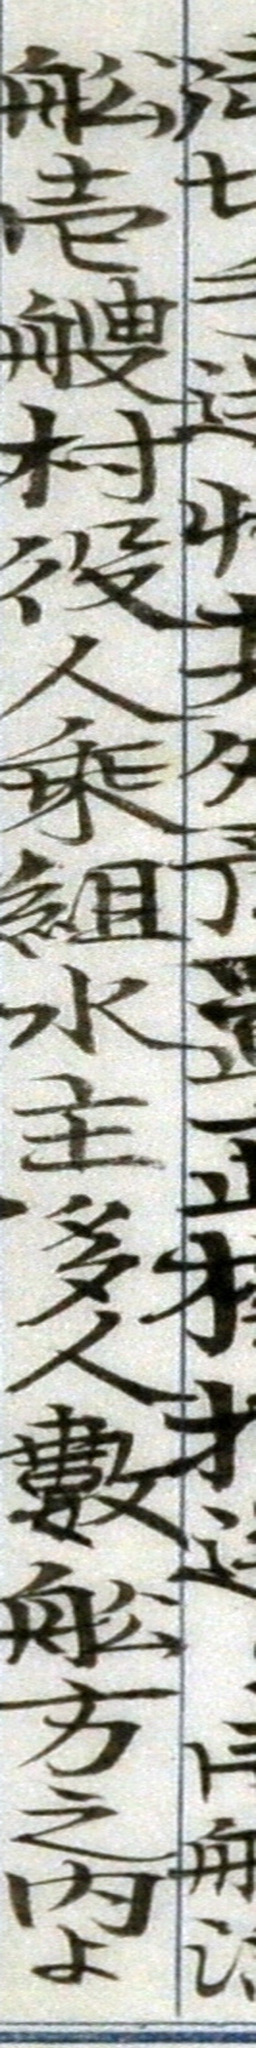船壱艘村役人乗組水主多人数船方内よ
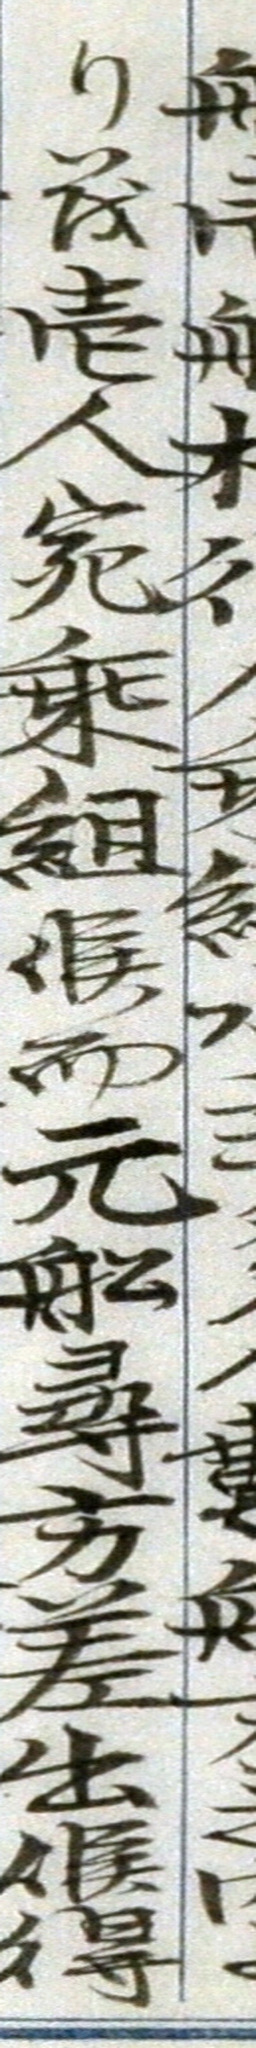りも壱人宛乗組候而元船尋方差出候得
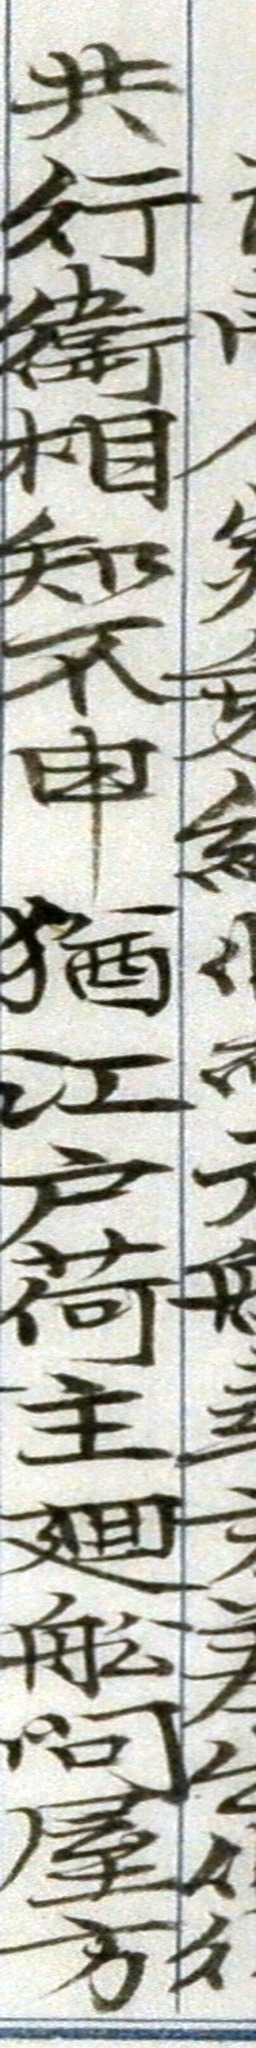共行ゑ相知不申猶江戸荷主廻船問屋方
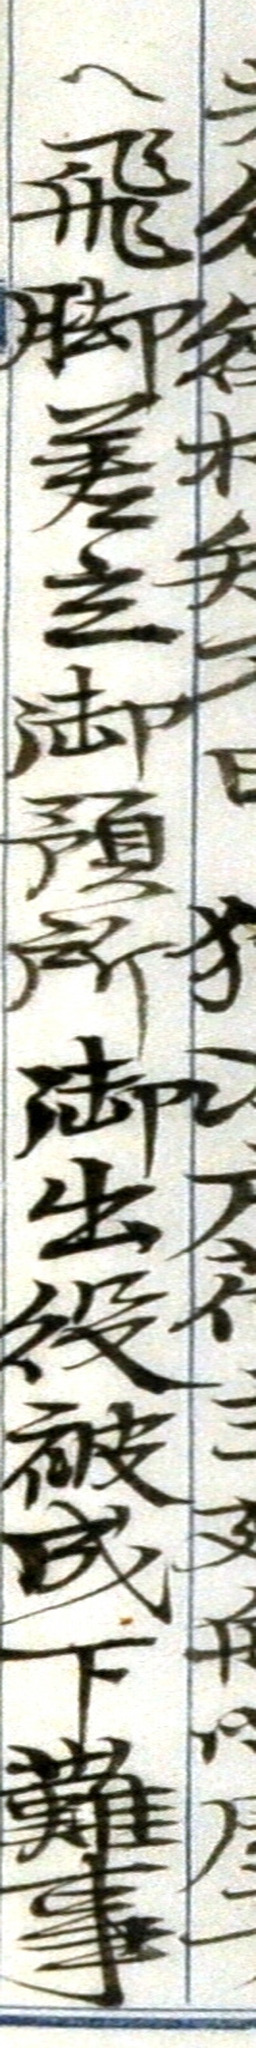へ飛脚差立御預所御出役被成下難事

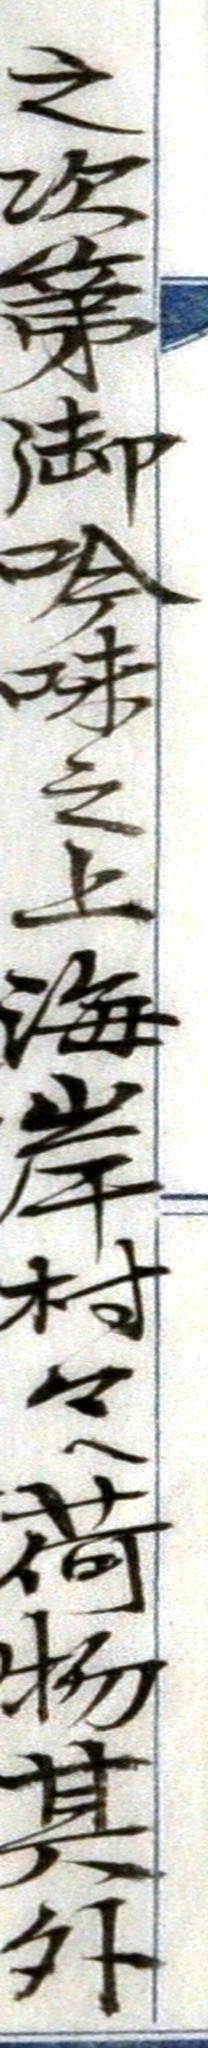之次第御吟味之上海岸村々へ荷物其外
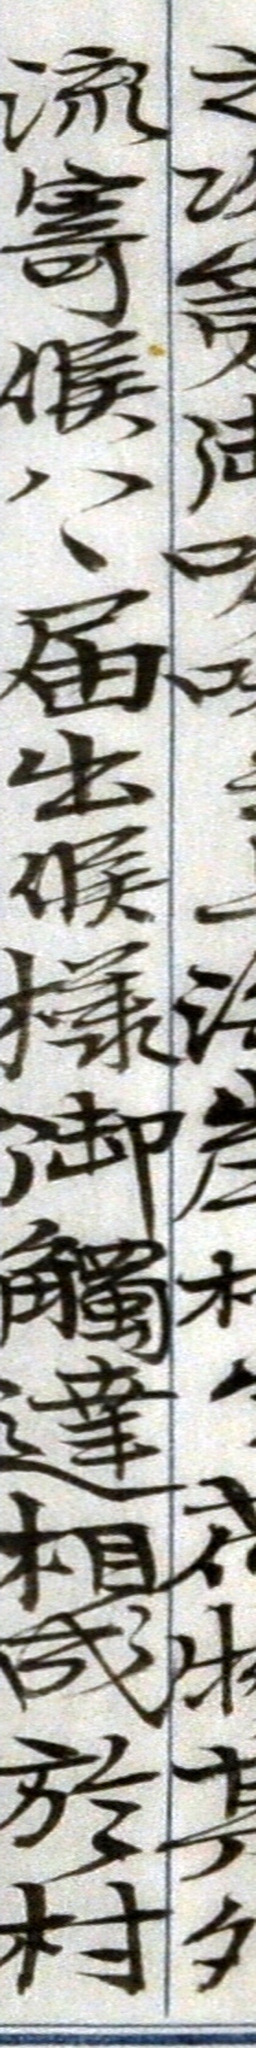流寄候はゝ届出候様御触達相成於村
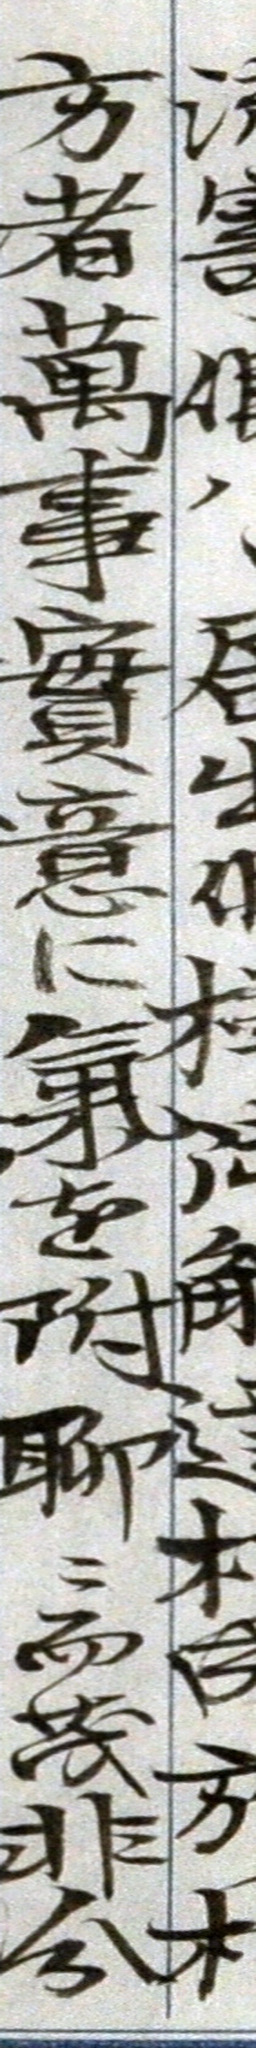片者万事実意に気を附聊ニ而も非分
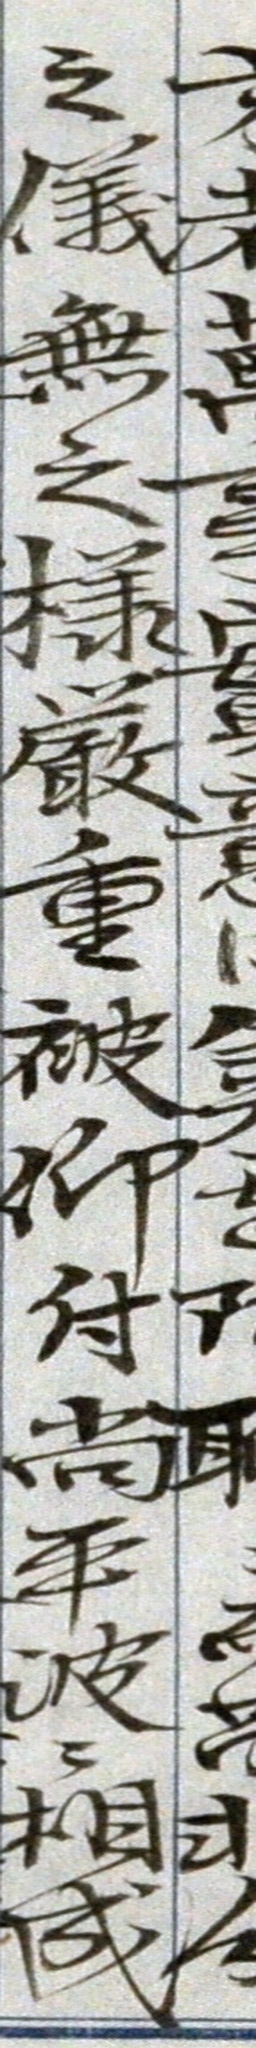之儀無之様厳重被仰付尚平波に相成
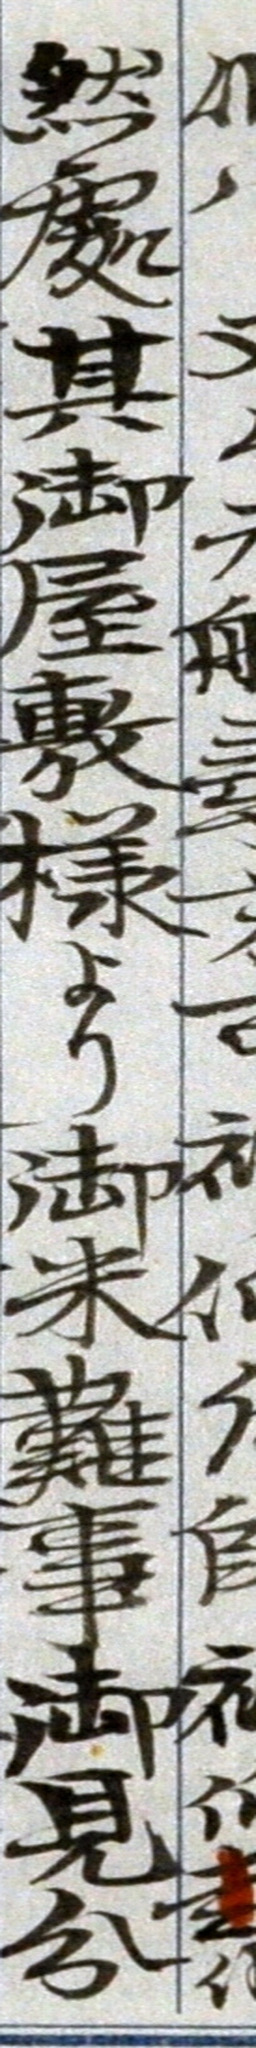然處其御屋敷様より御米難事御身分
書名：御廻米難船始末
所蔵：伊那市立高遠町図書館・合同会社AMANE
